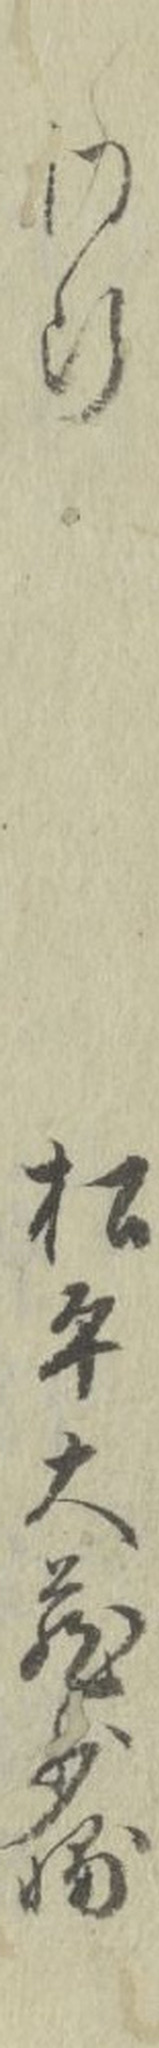同断松平大蔵少輔
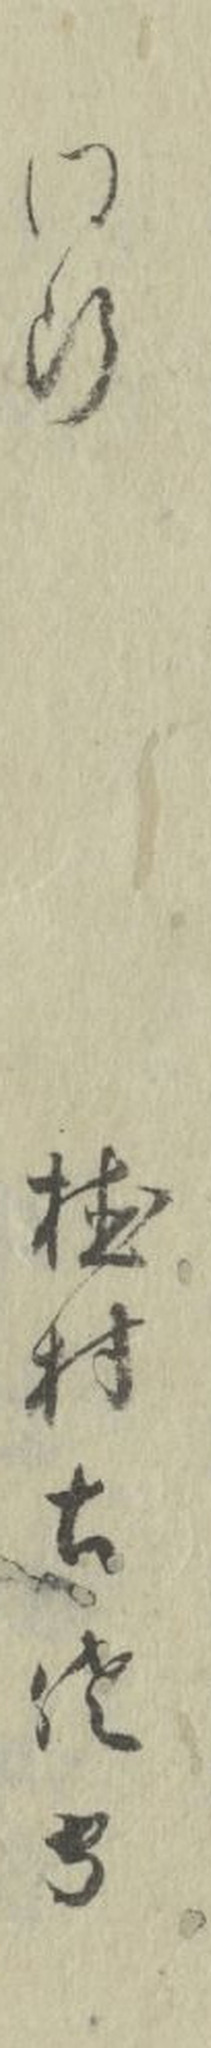同断植村土佐守
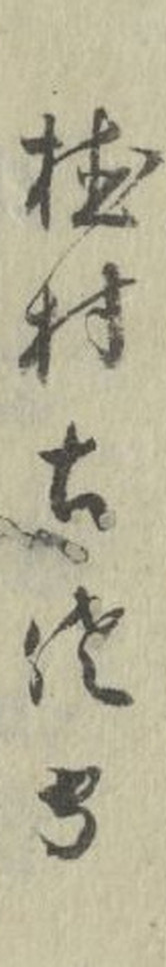同断植村土佐守
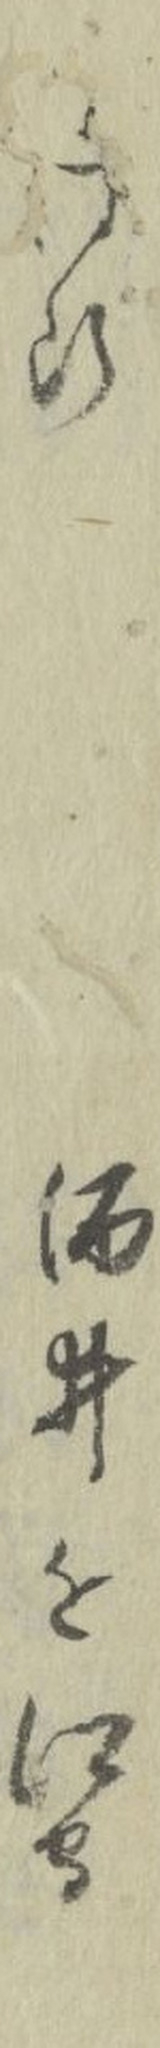同断酒井近江守
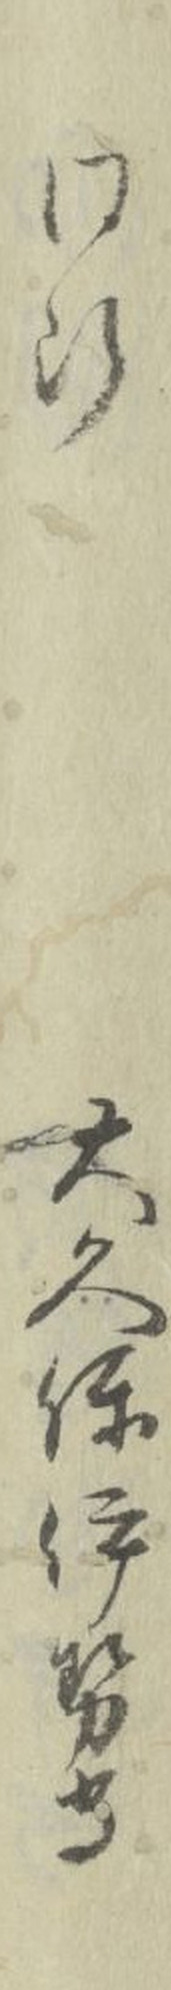同断大久保伊勢守
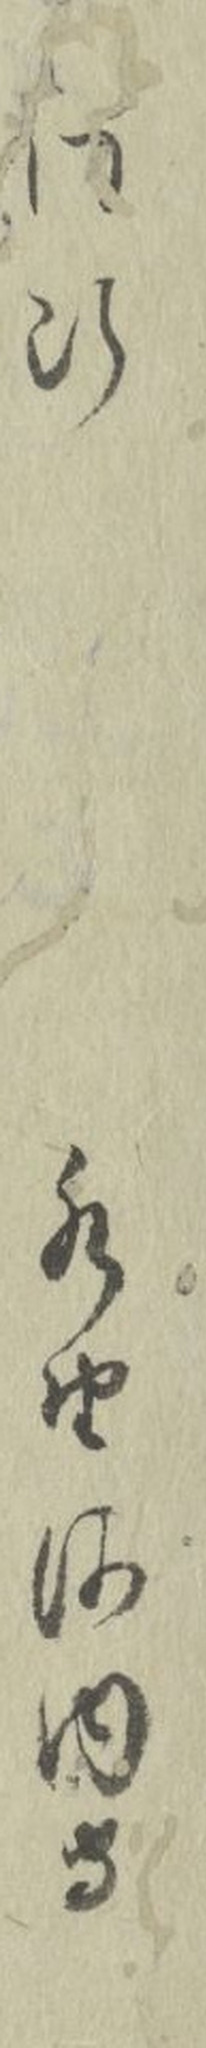同断水野河内守
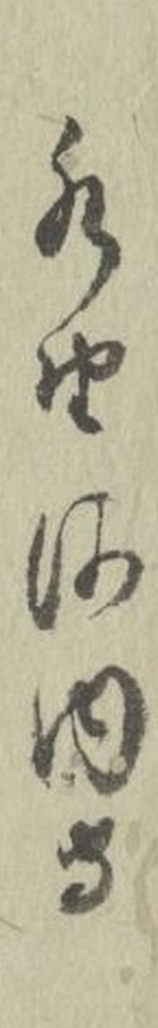同断水野河内守
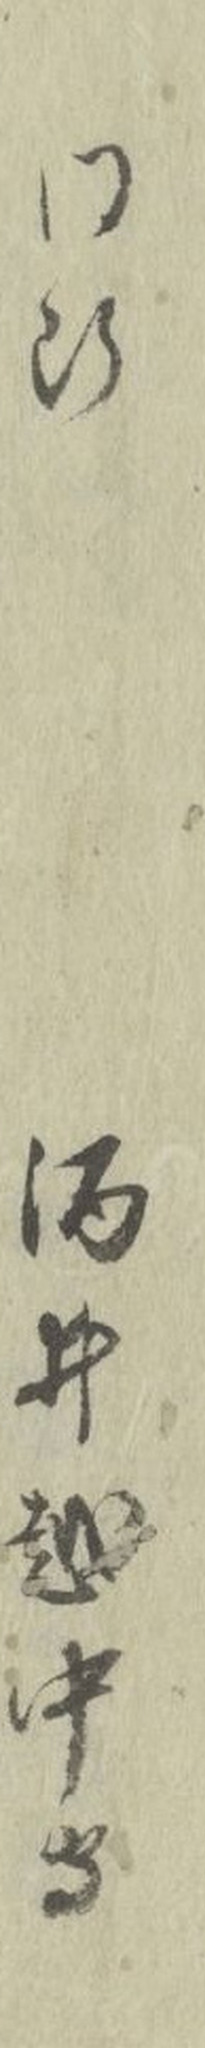同断酒井越中守
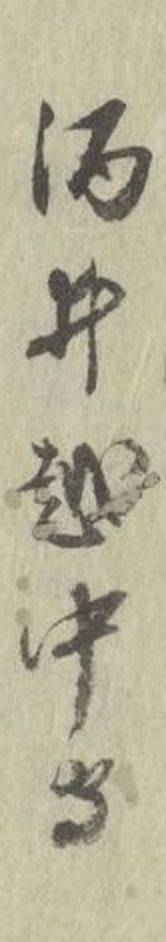同断酒井越中守
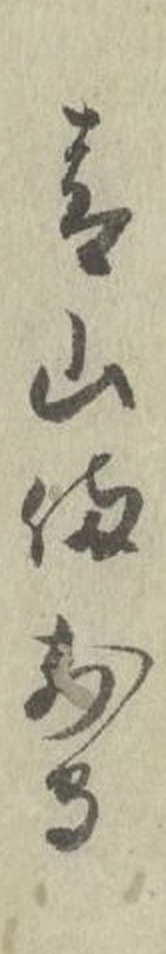同断青山備前守

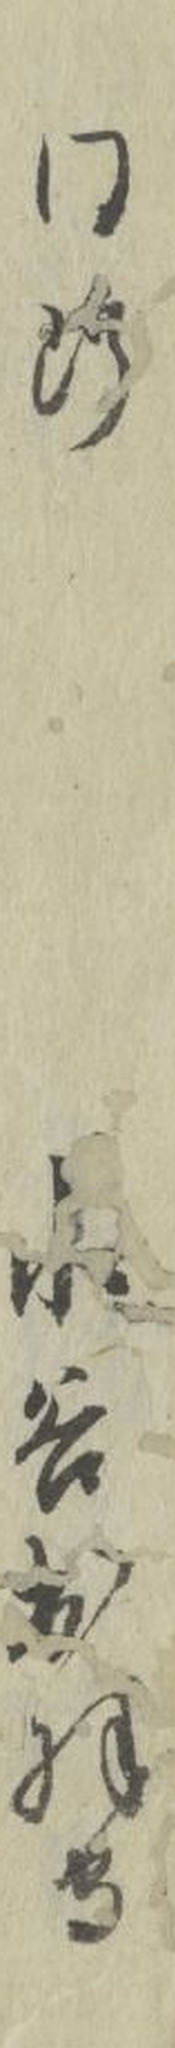同断小谷出羽守
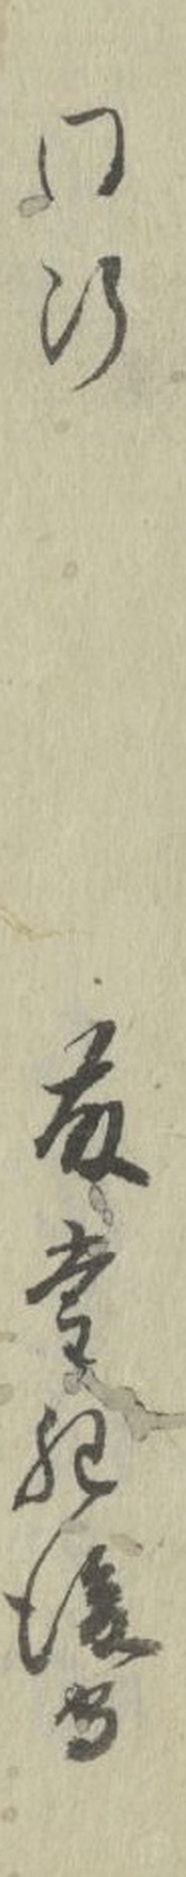同断藤堂肥後守
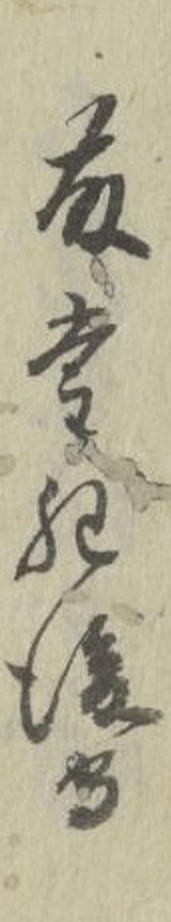同断藤堂肥後守
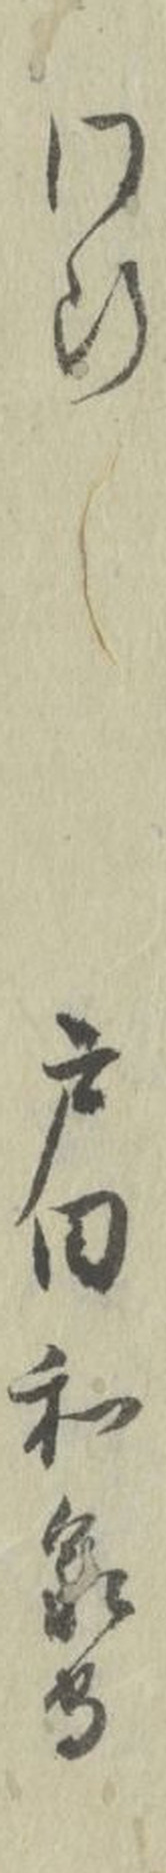同断戸田和泉守
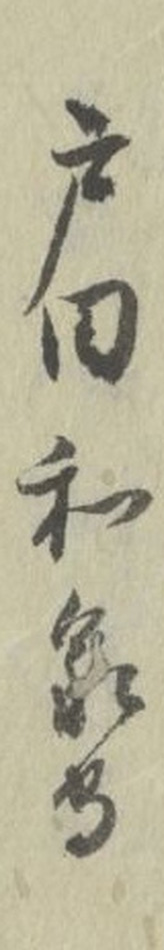同断戸田和泉守
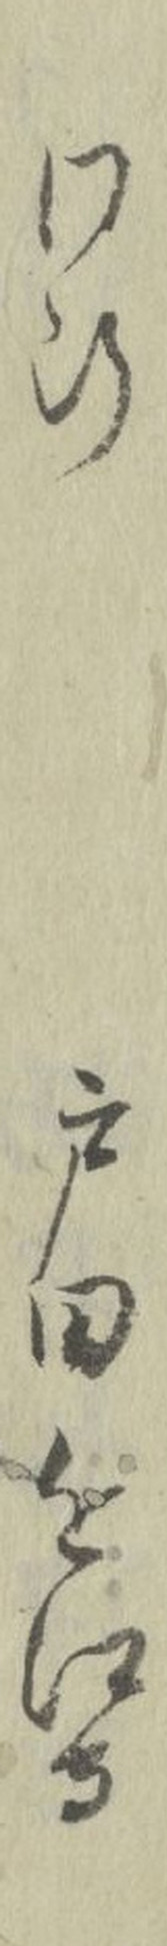同断戸田近江守
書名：琉球来朝記 自一至七
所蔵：University of the Ryukyus Library
